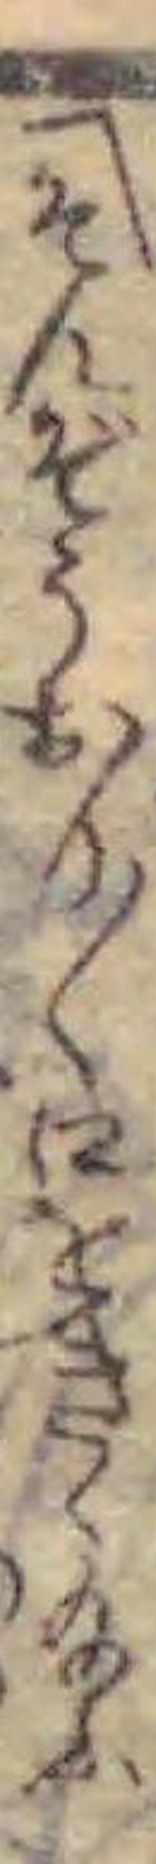〽そんぞうおり〳〵口をきゝ給ふ
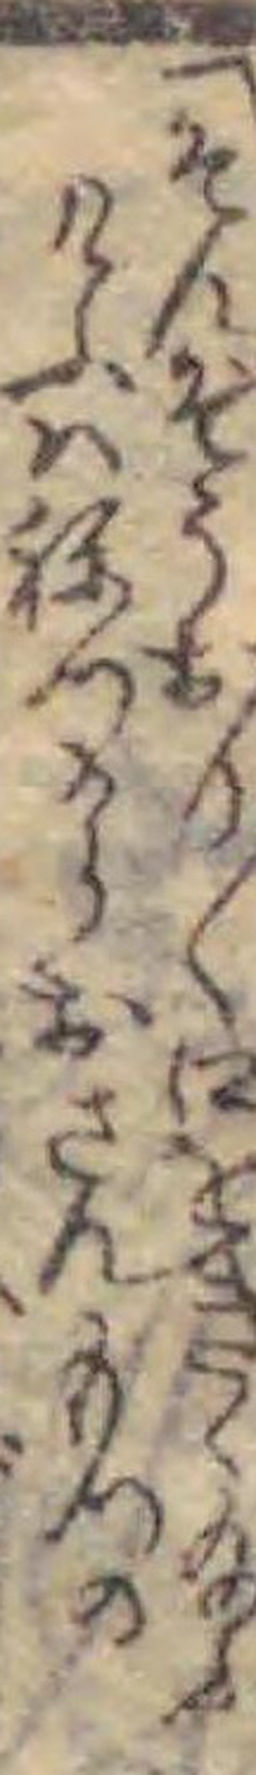けふはねつからおさんもつの
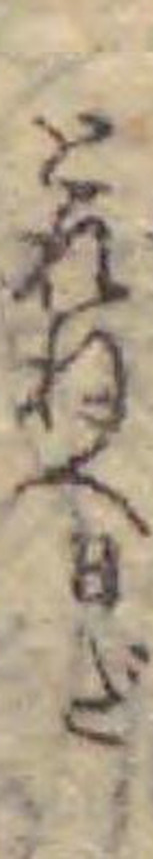とれねへ日だ
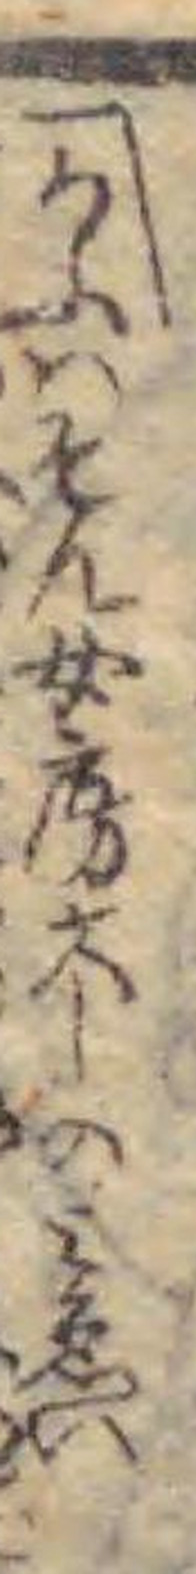〽かふはそん女房大しのみゑい
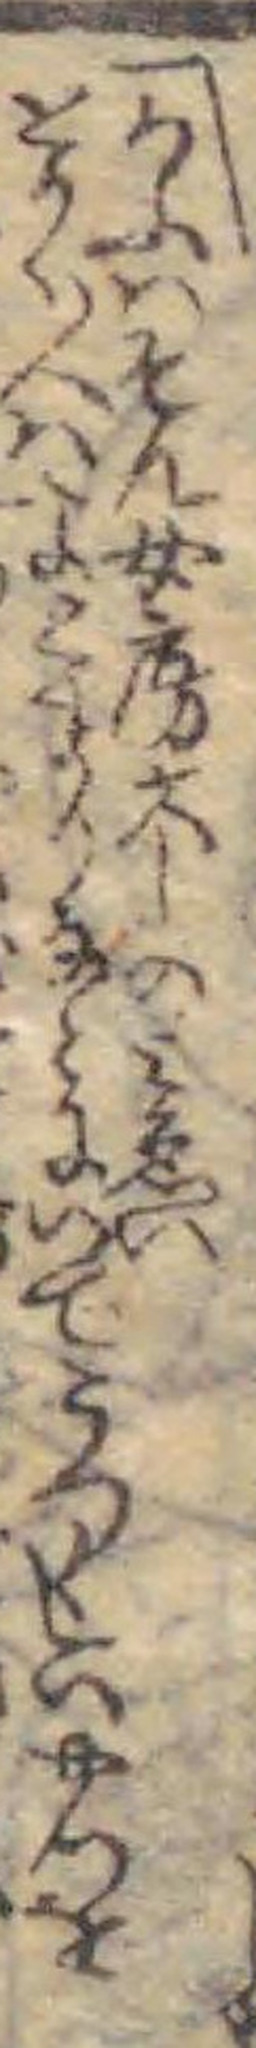とかく人はよとまりなとにいでうつくしいやつを
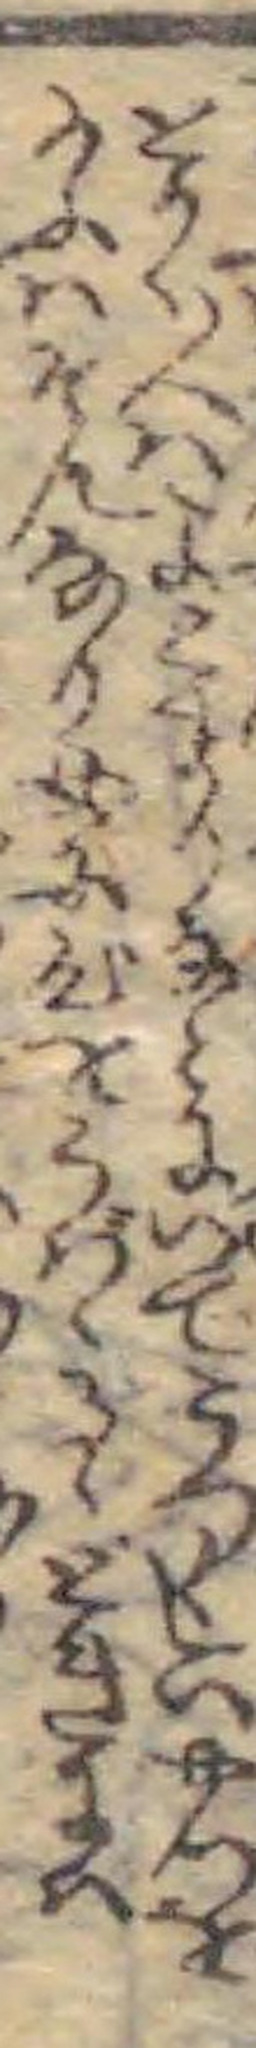かふはそんなり女に心をうばゝるゝときには
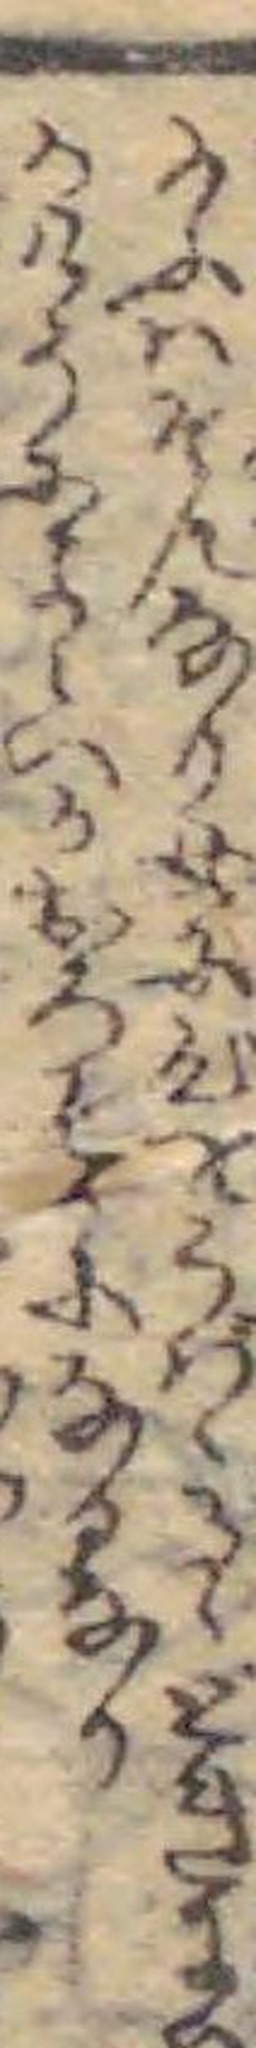かけうによらいかおろそかになるなり
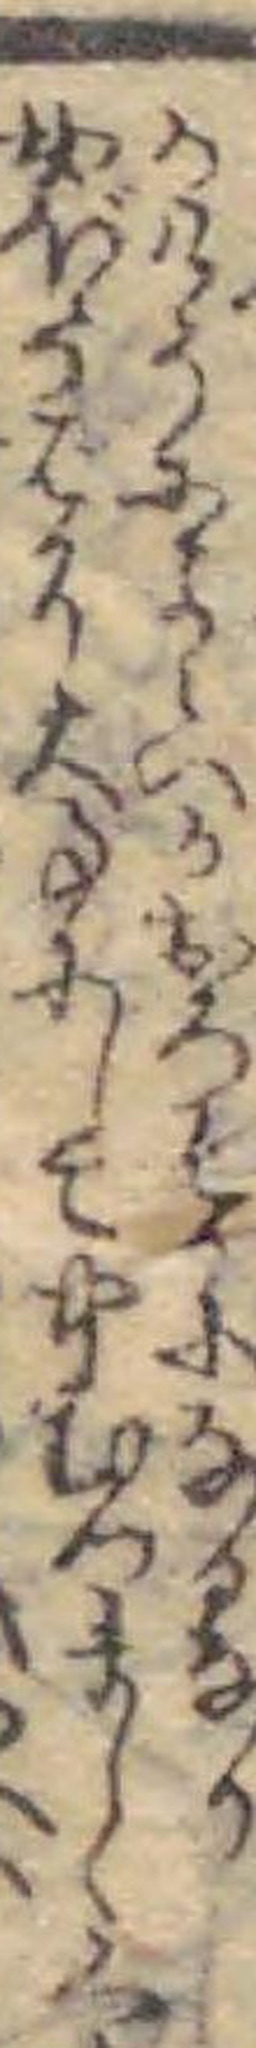女ぼうばかり大事にして中むつましくくらす
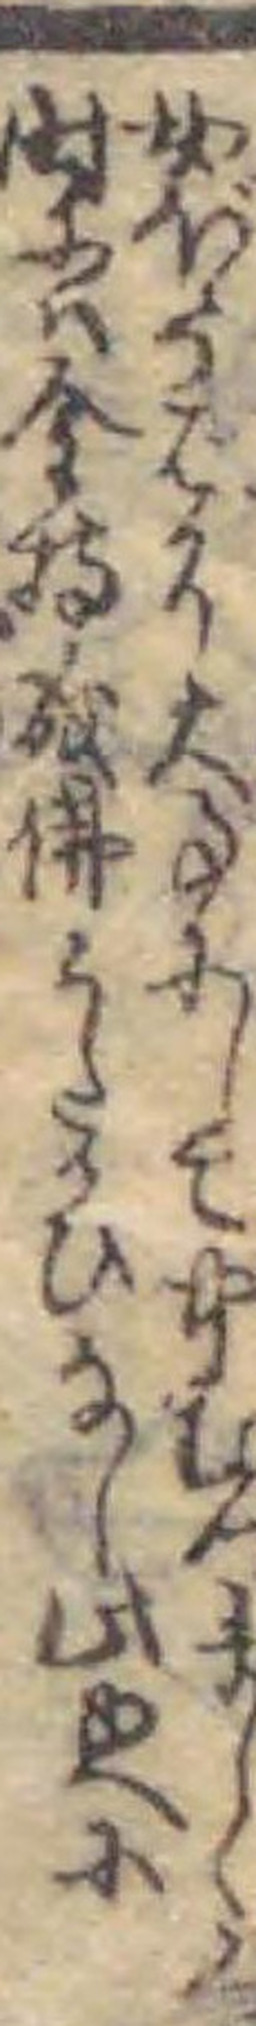時には金持成仏うたかひなし此ゆへに
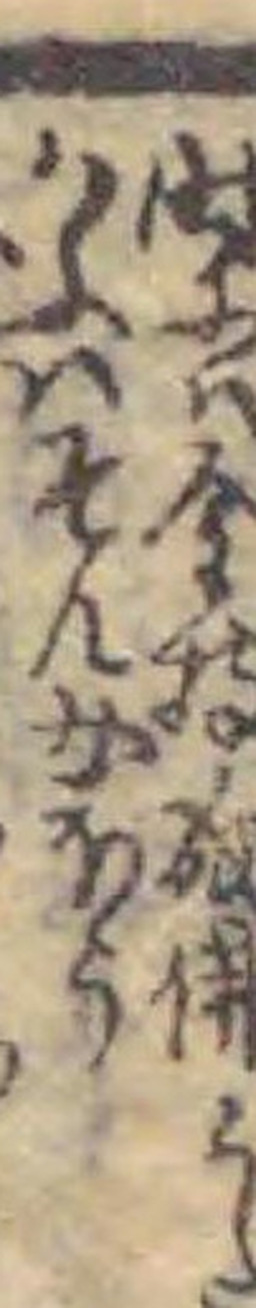かふはそん女ほう
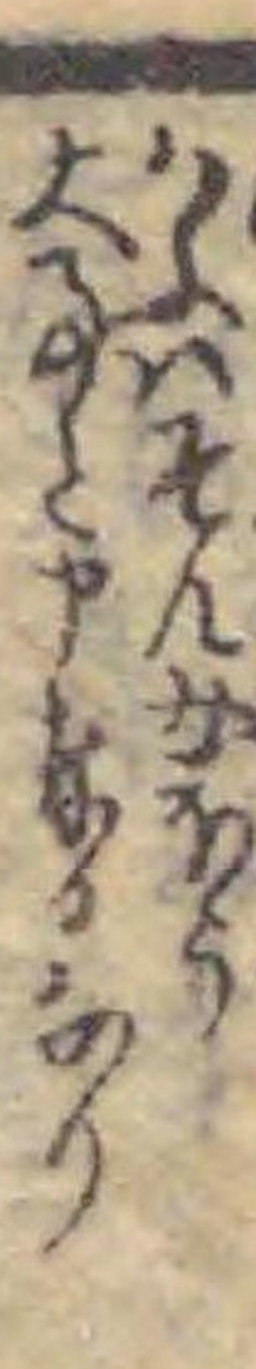大事と申奉るなり
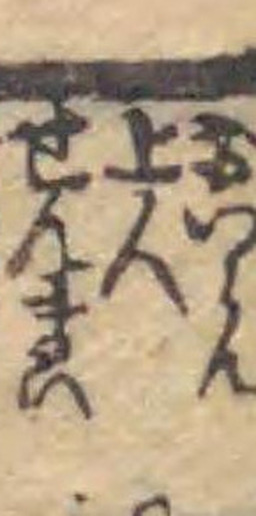せんまい
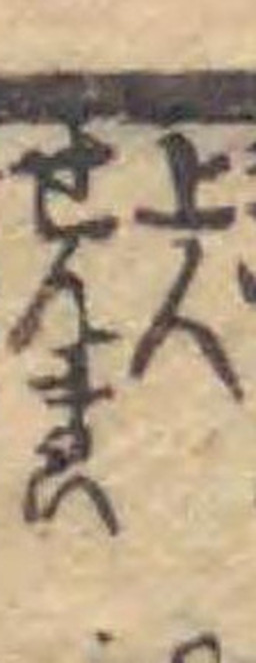せんまい
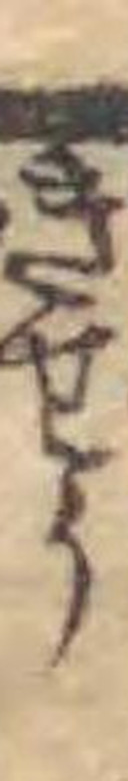きせう
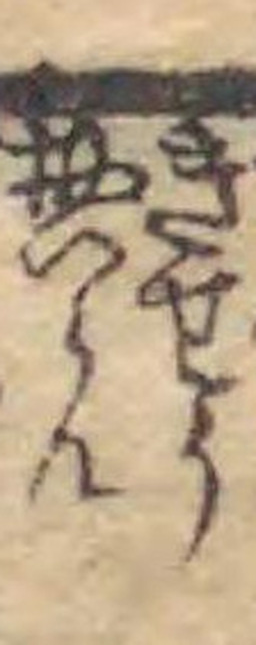おいらん
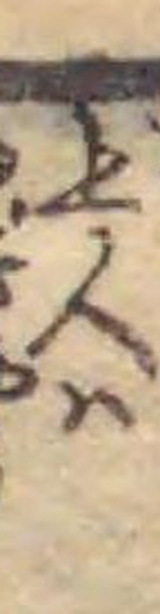上人は
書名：身体開帳略縁起 : 3巻
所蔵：国立国会図書館 National Diet Library, JAPAN
